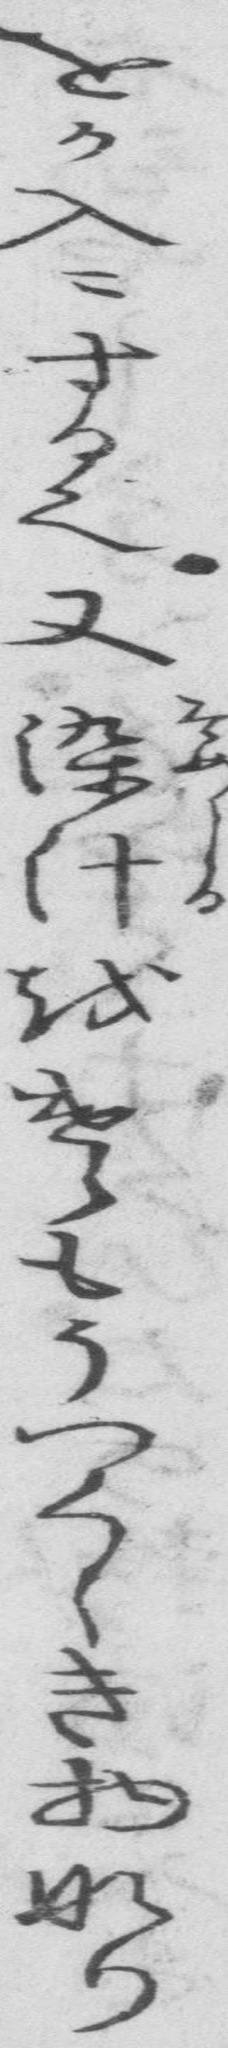をか入にする也。又染汁を遣うもうつくしき物なり
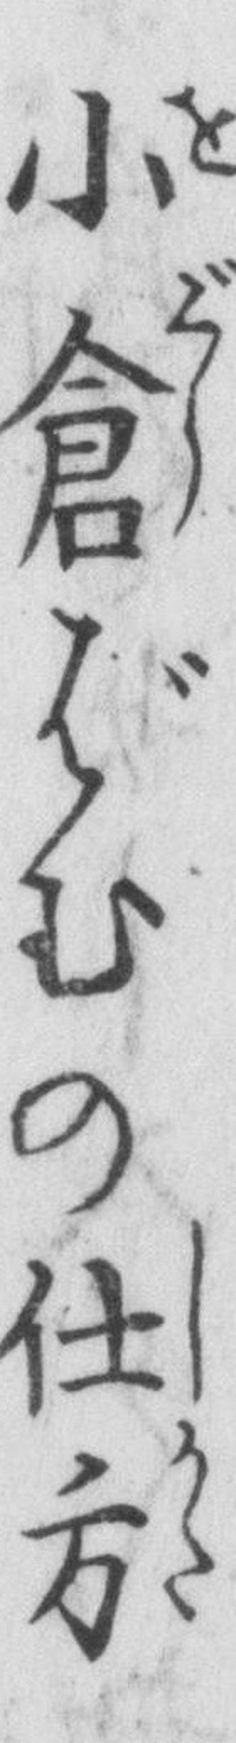小倉ばむの仕方
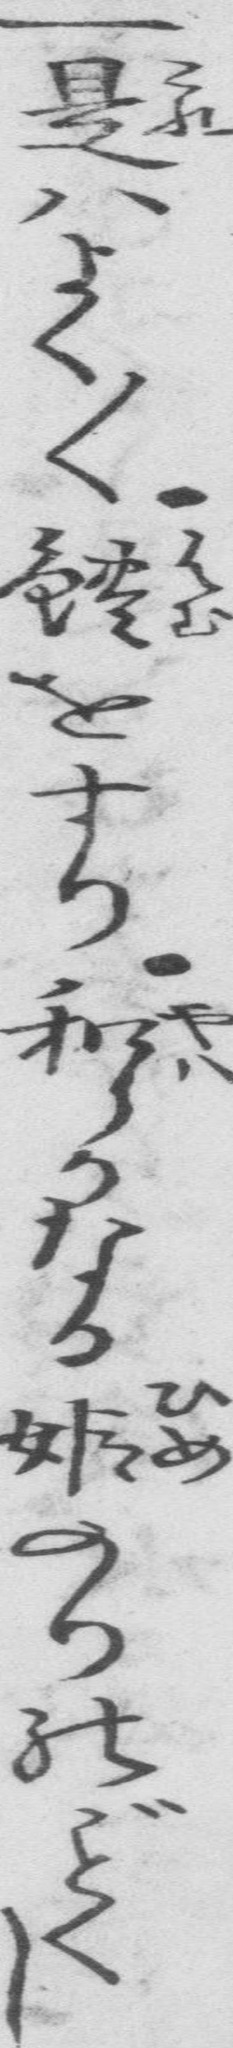一是はよく〳〵。鱧をすり。和らかなる姫のりのごとくし
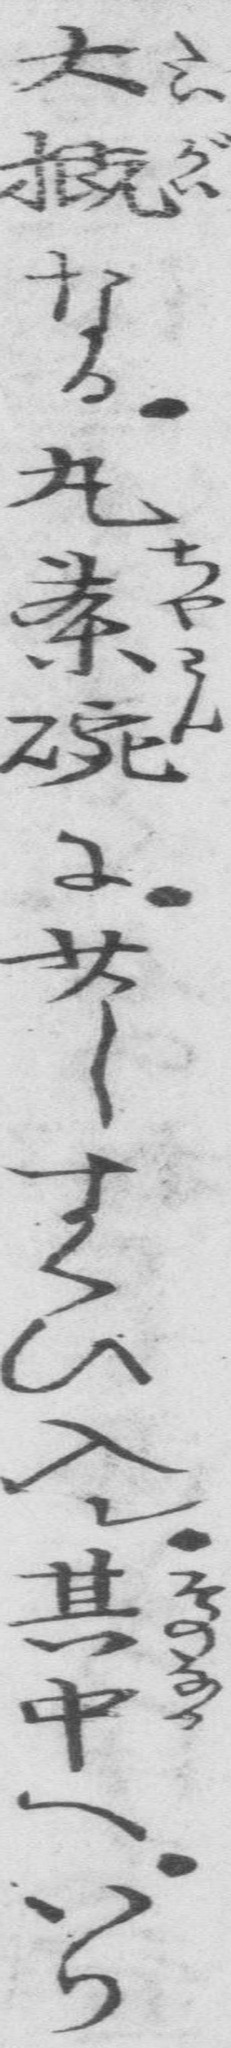大概なる。丸茶碗に。少しすくひ入れ。其中へいり
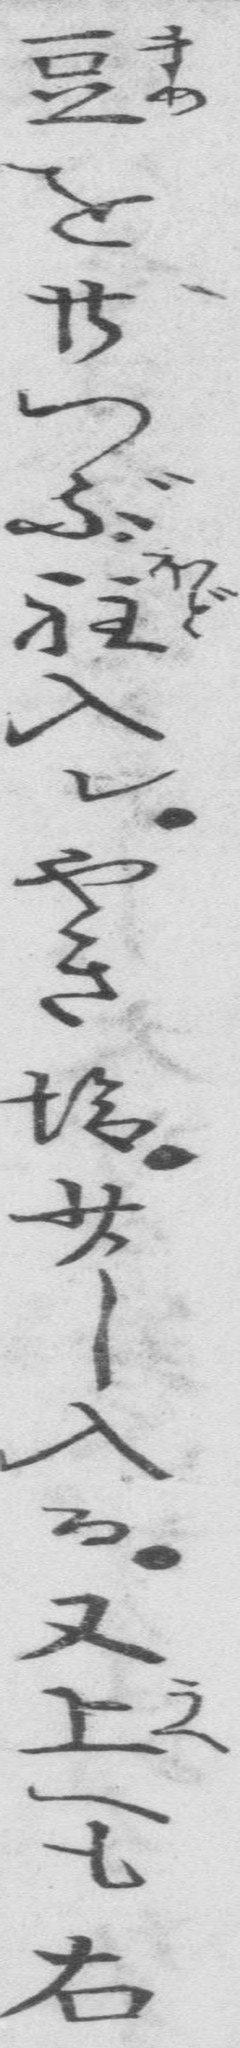豆を廿つぶ程入れ。やき塩。少し入る。又上へも右
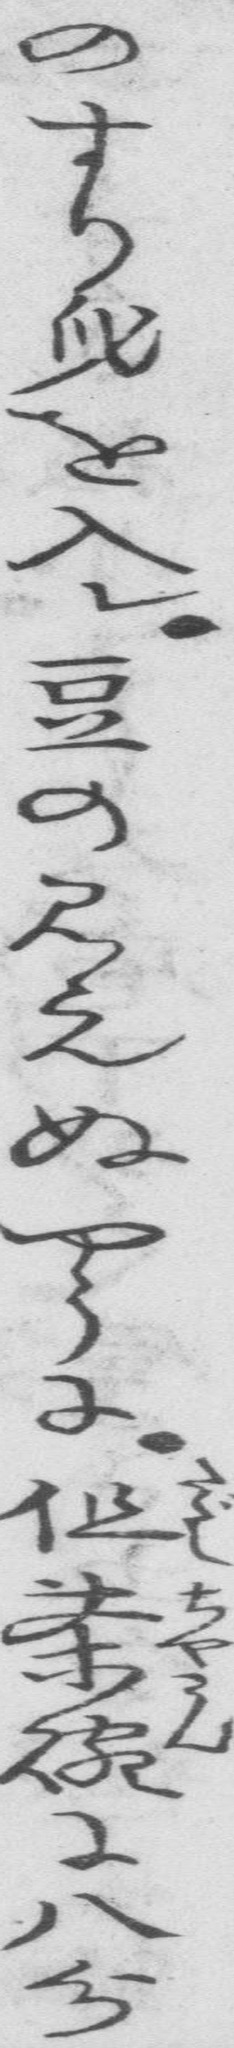のすり身を入れ。豆の見えぬやうに。但茶碗に八分
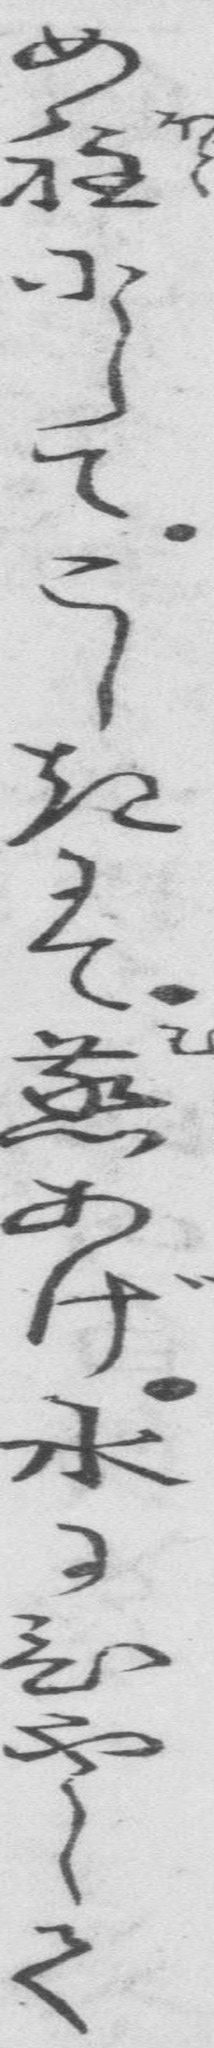め程にして。こしきにて。蒸あげ。水にひやして
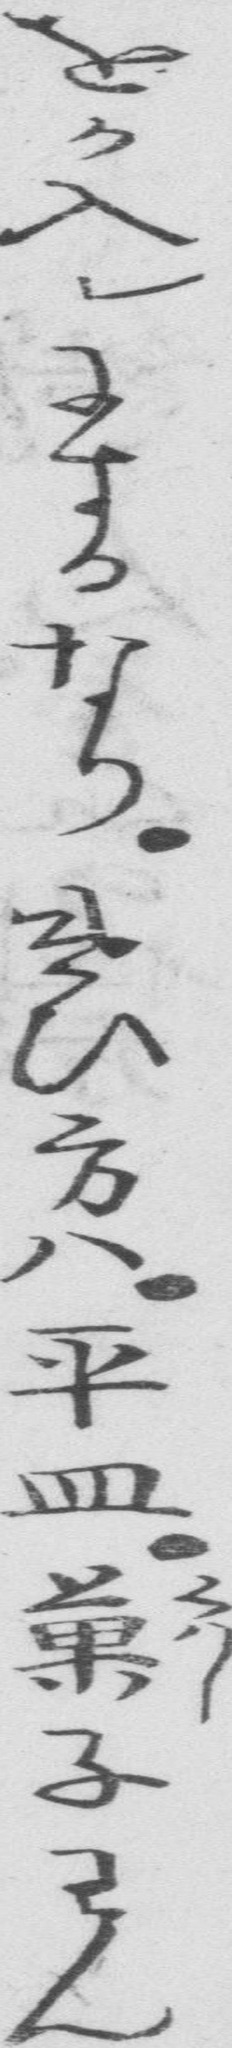をか入れにするなり。遣ひ方は。平皿。菓子わん
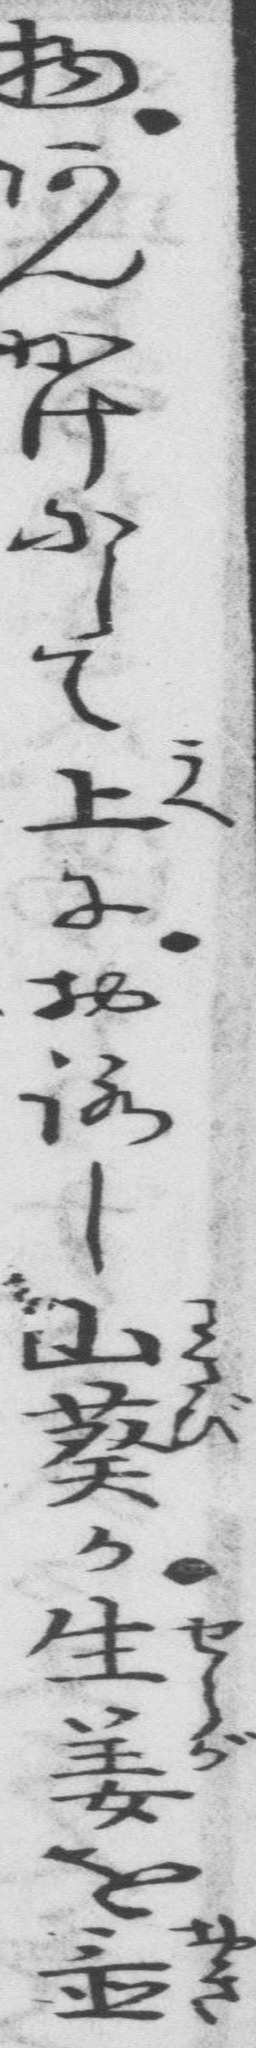物。あんかけにして上に。おろし山葵か。生姜を置
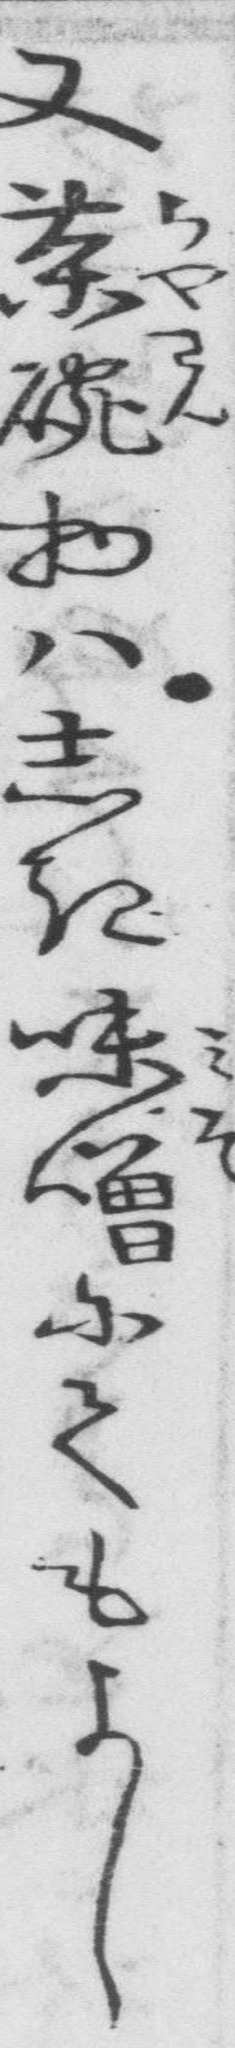又茶碗物は。しき味噌にてもよし
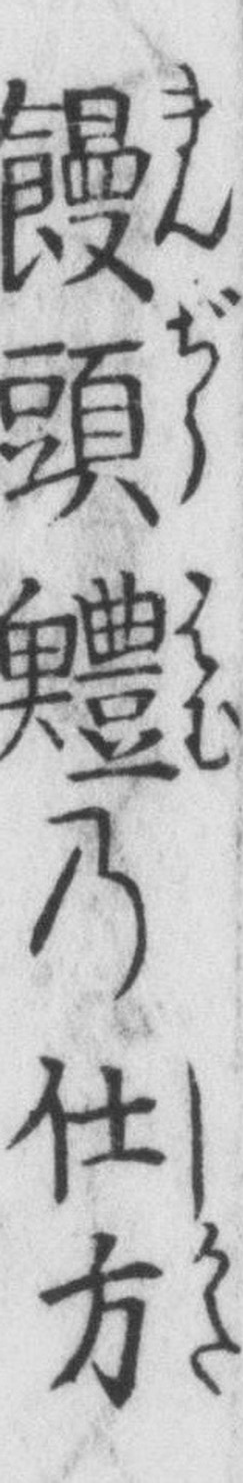饅頭鱧の仕方
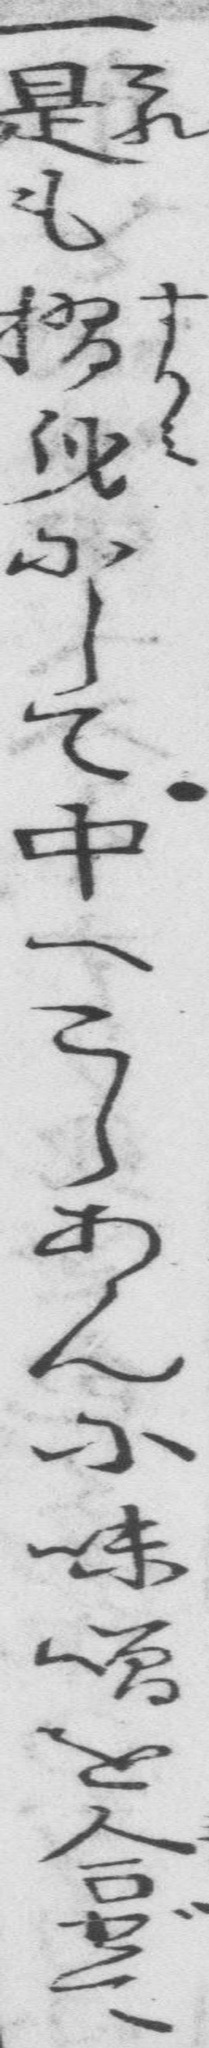一是も摺身にして。中へこしあんに味噌を合ぜて
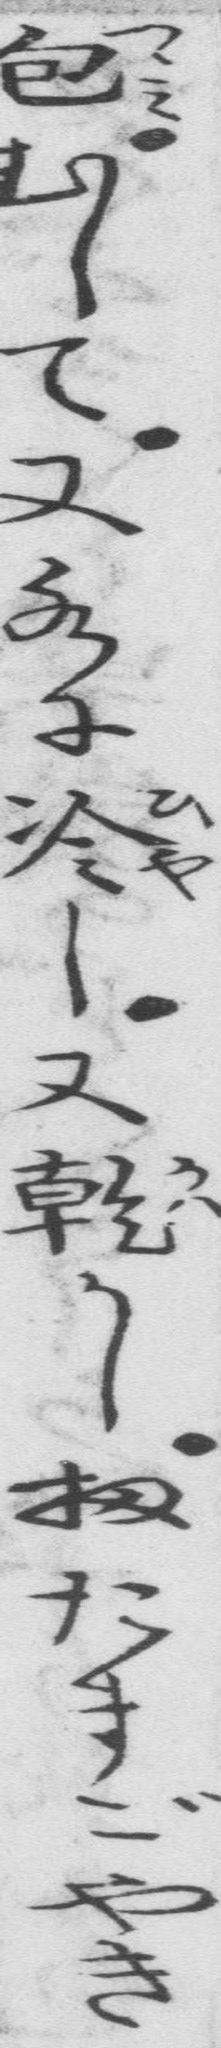包。むして。又水に冷し。又乾かし。扨たまごやき
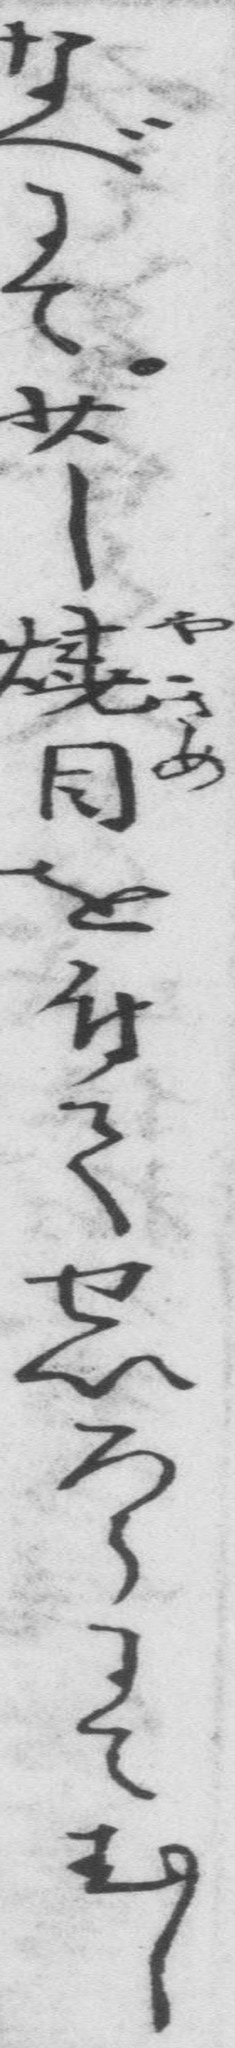なべにて。少し焼目を付てせいろうにてむし
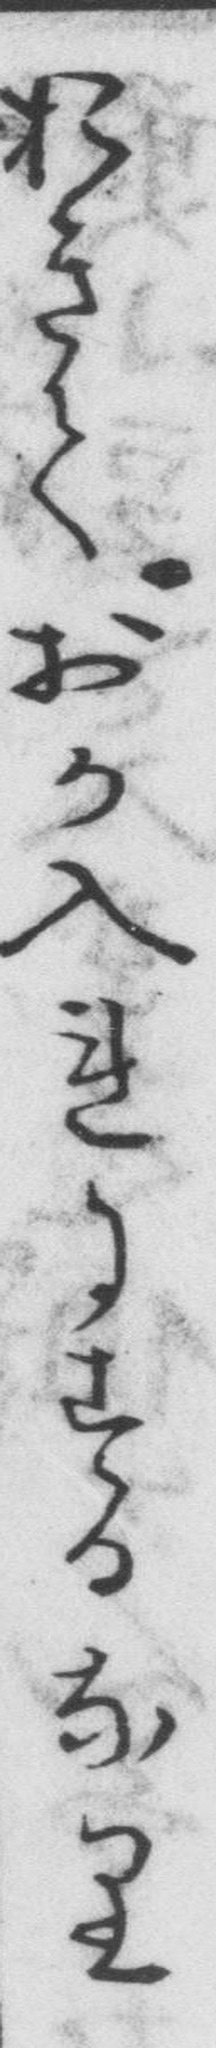おきて、おか入れにするなり
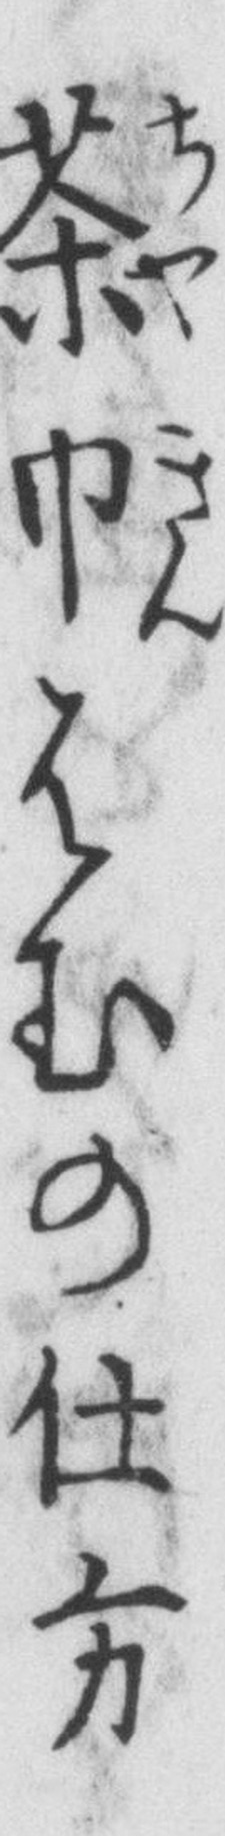茶巾はむの仕方
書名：萬寳料理秘密箱
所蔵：大阪府立大学学術情報センター 国文学研究資料館
